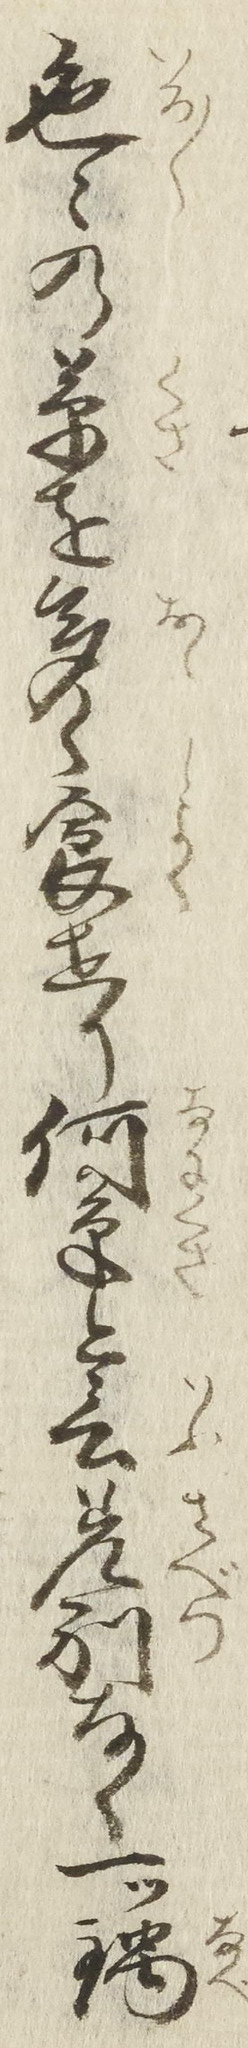色〻の草を多く食せり何草と言差別なく一ツ鍋
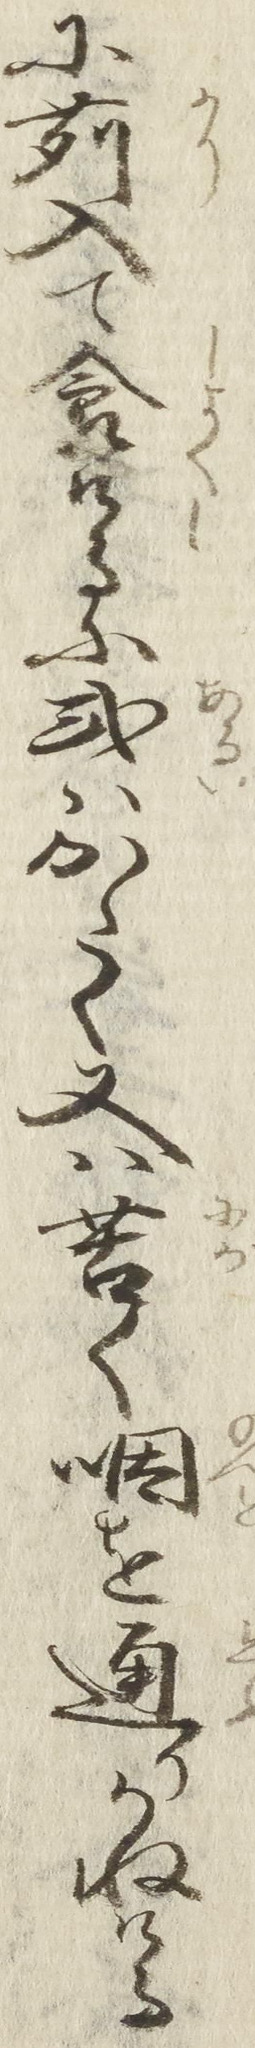に苅入て食けるに或はかたく又は苦く咽を通りかねける
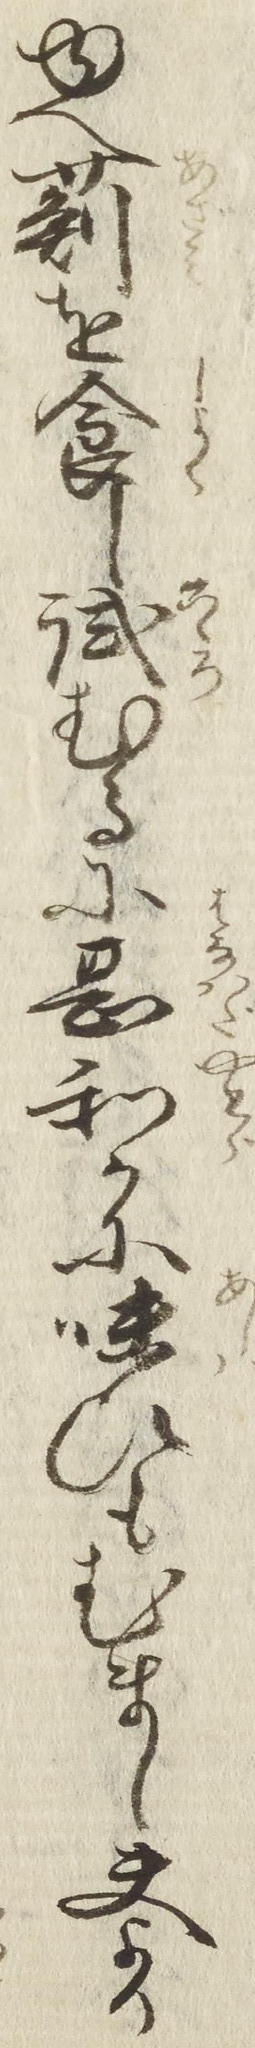ゆへ薊を食し試むるに甚和かに味ひもむまし夫より
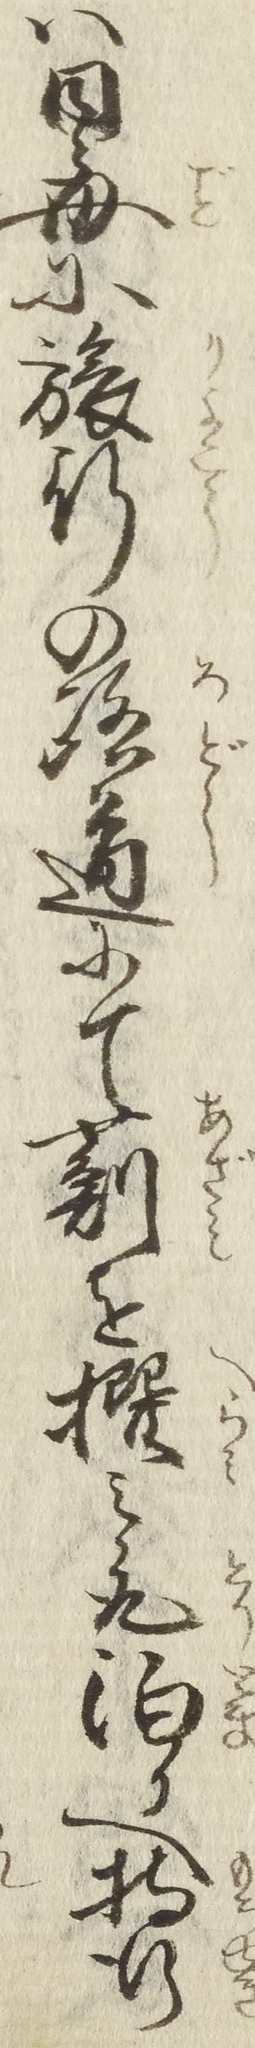は日毎に旅行の路道にて薊を撰み取泊りへ持行
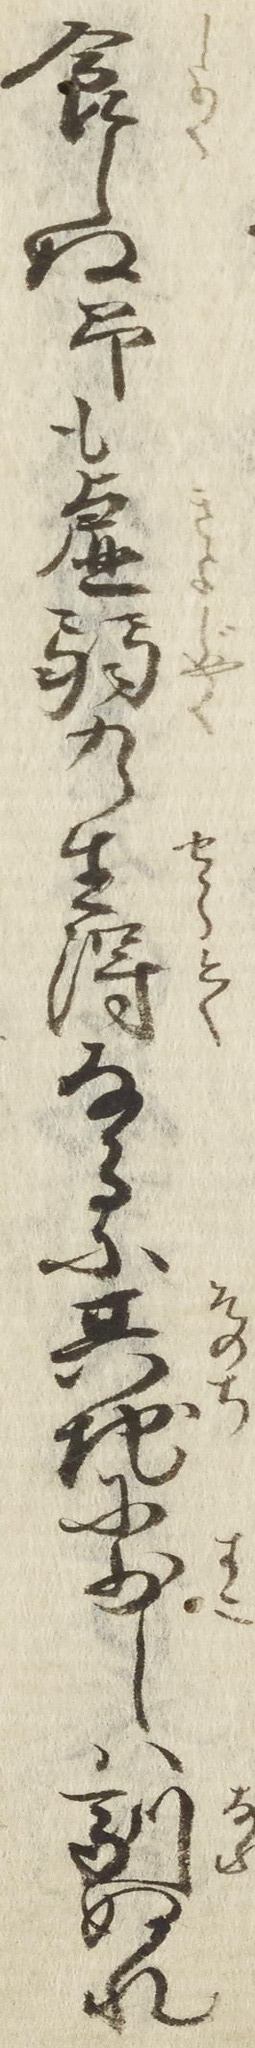食しぬ予も虚弱の生得なるに其地に少しは馴ぬれ
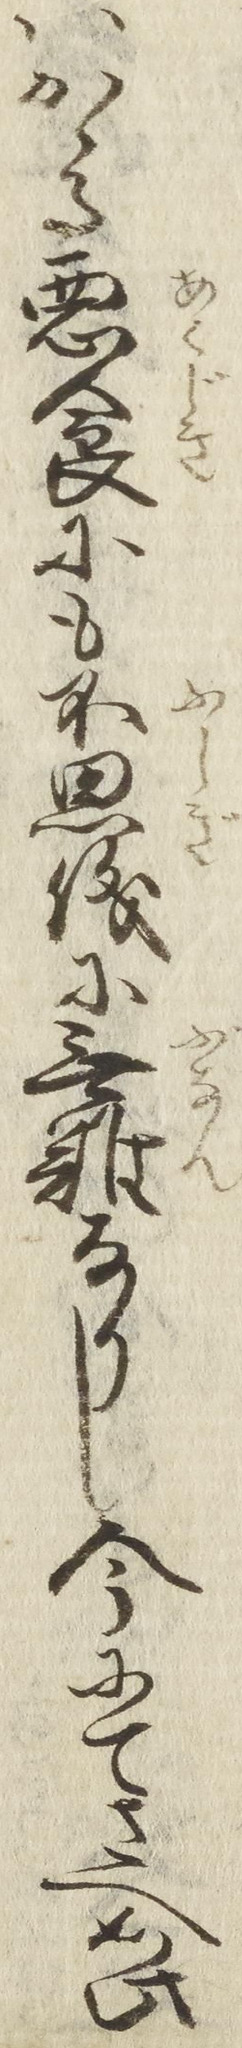はかゝる悪食にも不思儀に無難なりし今にてさへ如此

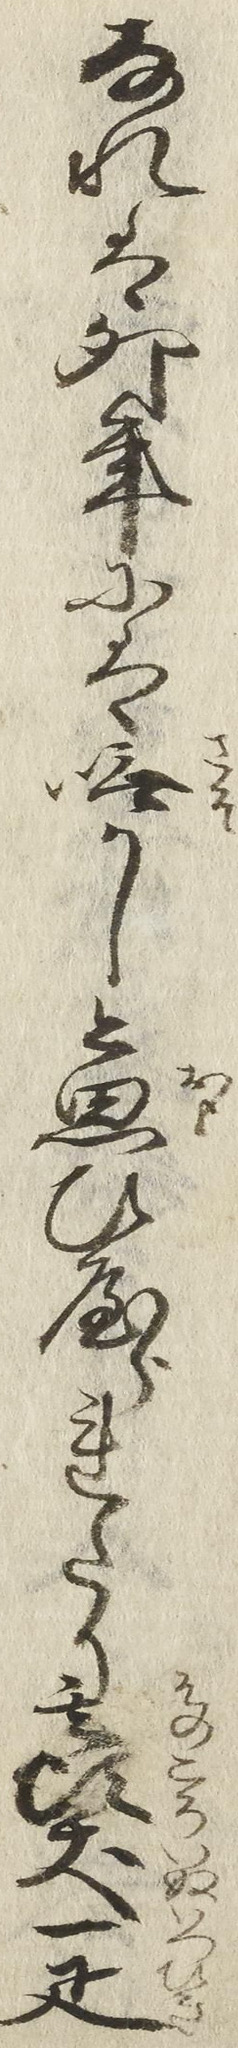なれは卯年には嘸かしと思ひやられたり其頃犬一疋
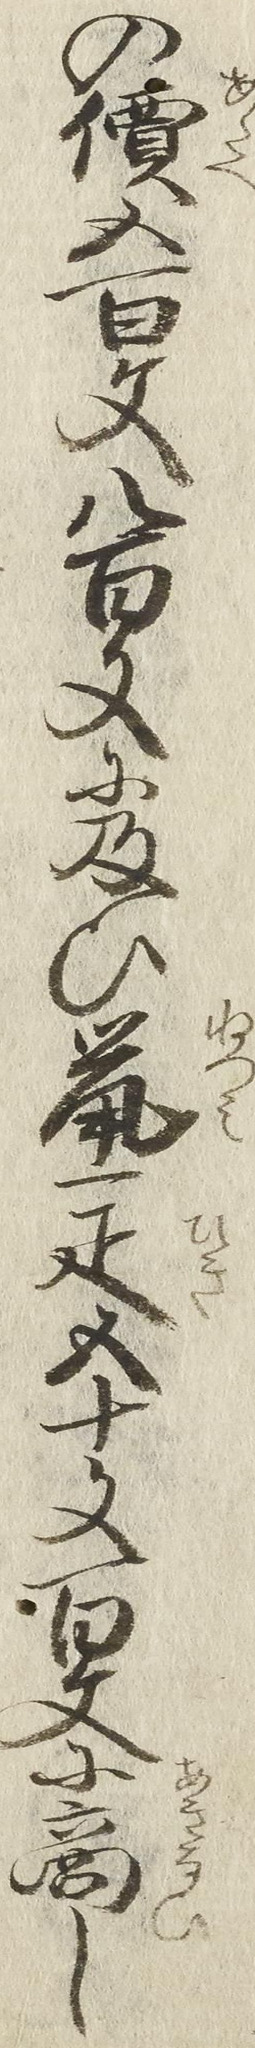の価五百文八百文に及ひ鼠一疋五十文百文に商し
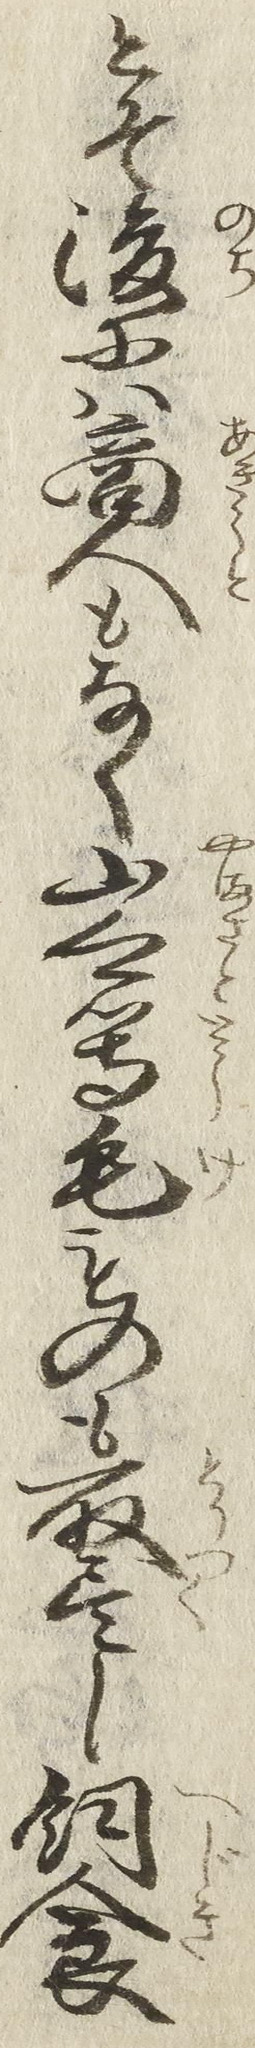とそ後には商人もなく山郷等毛ものも取尽し飼食
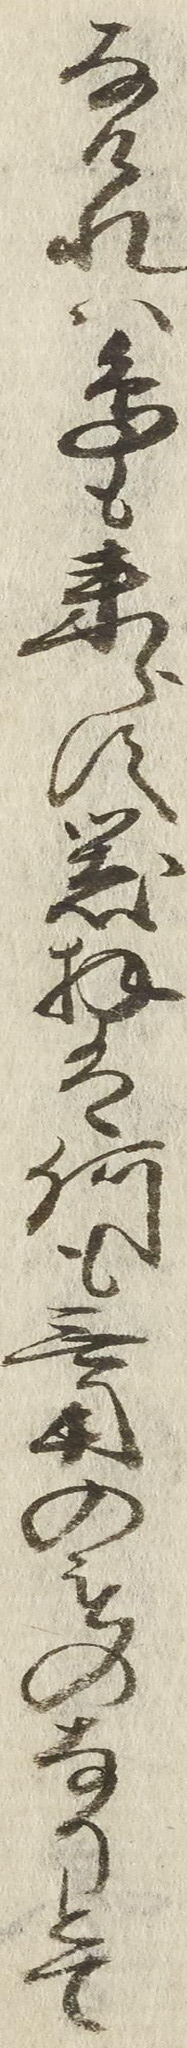なけれは鳥も来らす器物は何も無用のものなりとて
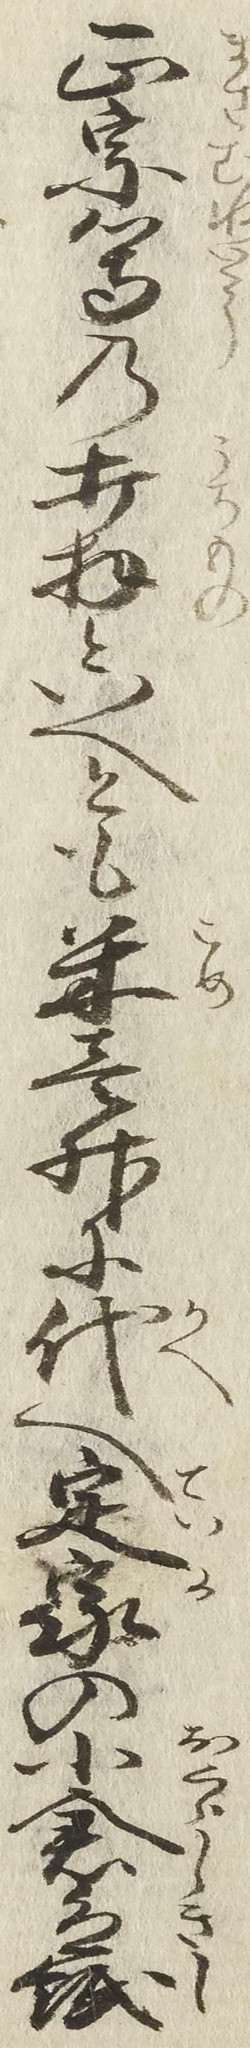正宗等の打物といへとも米壱升に代へ定家の小倉色紙
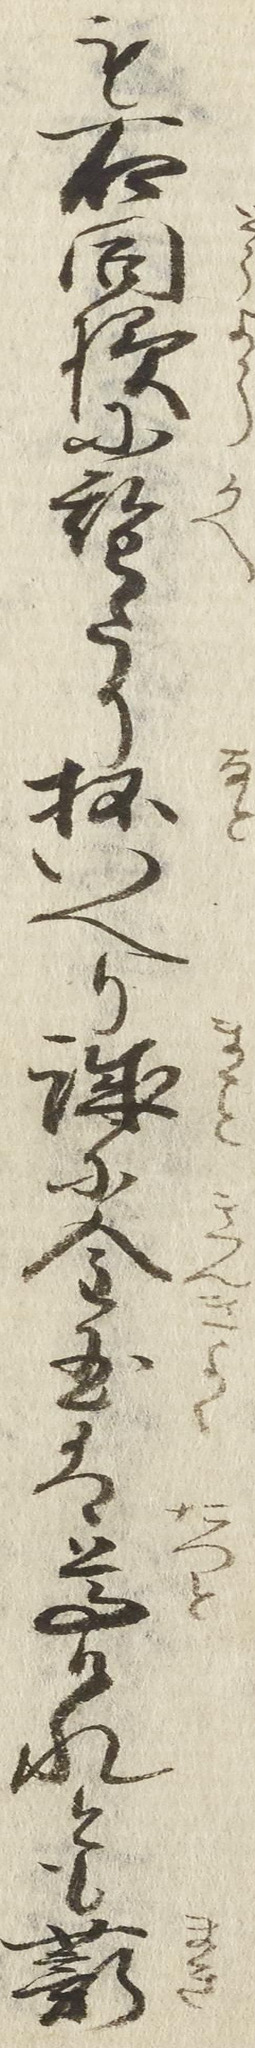も右同様に替たり抔いへり誠に金玉は尊けれとも薪
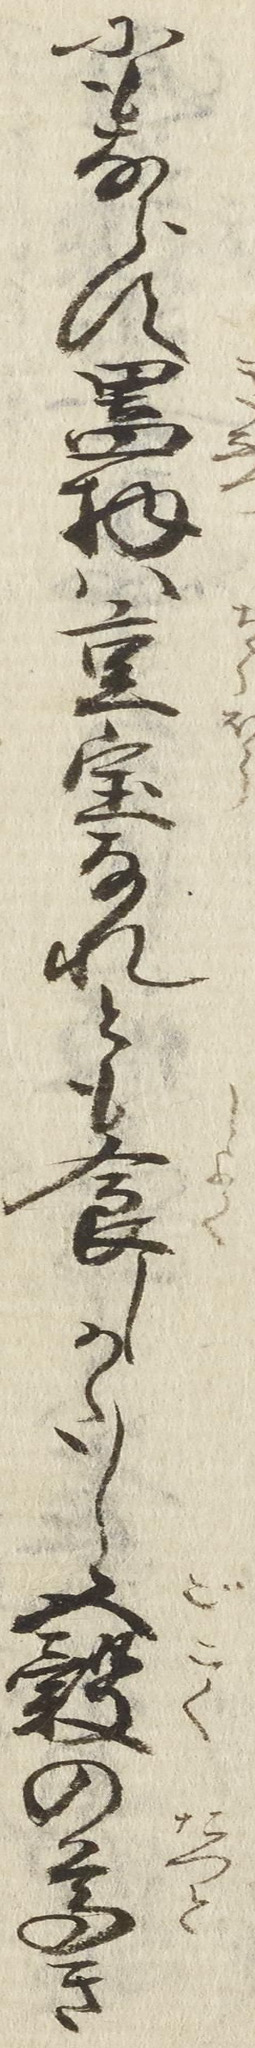にもならす器物は重宝なれとも食しかたし五穀の尊き
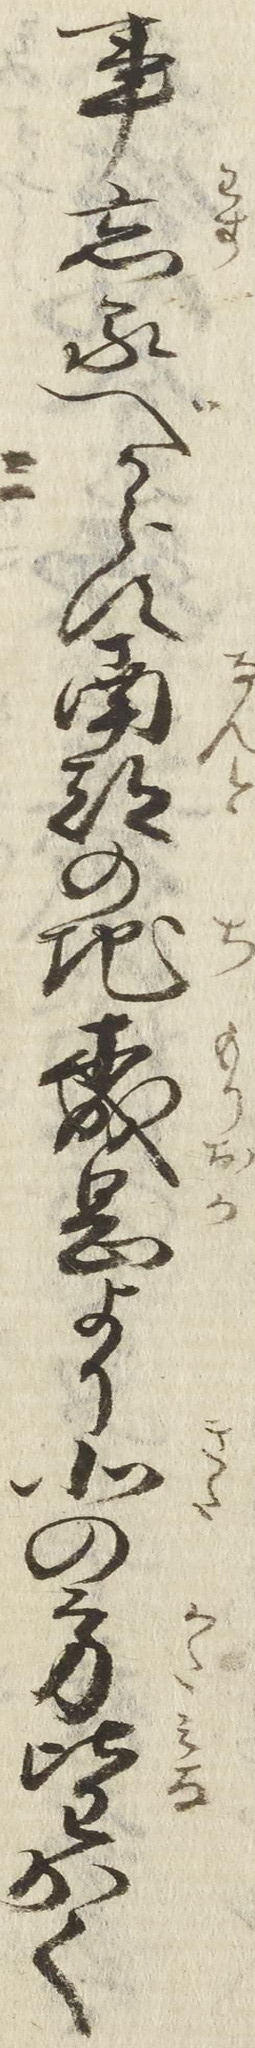事忘るべからす南都の地森岡より北の方皆かく
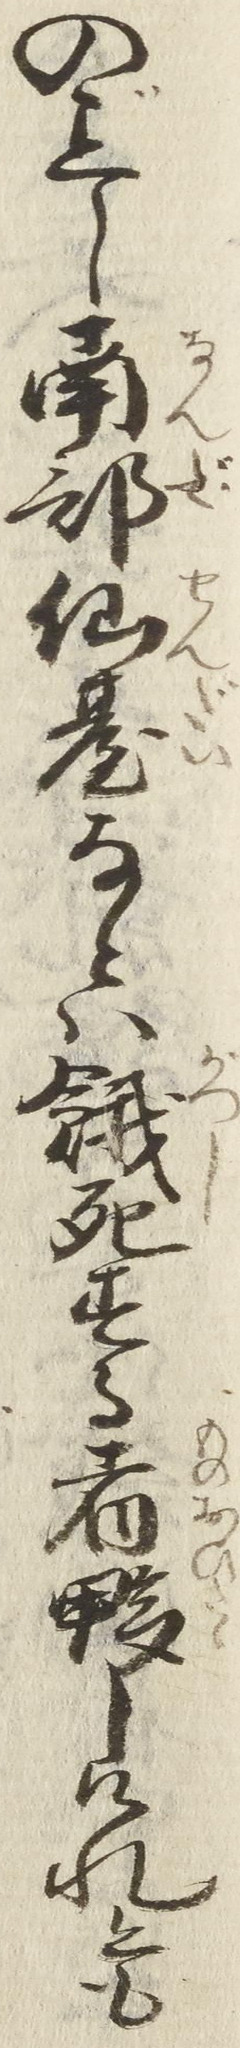のごとし南部仙臺なとは餓死する者夥しけれとも
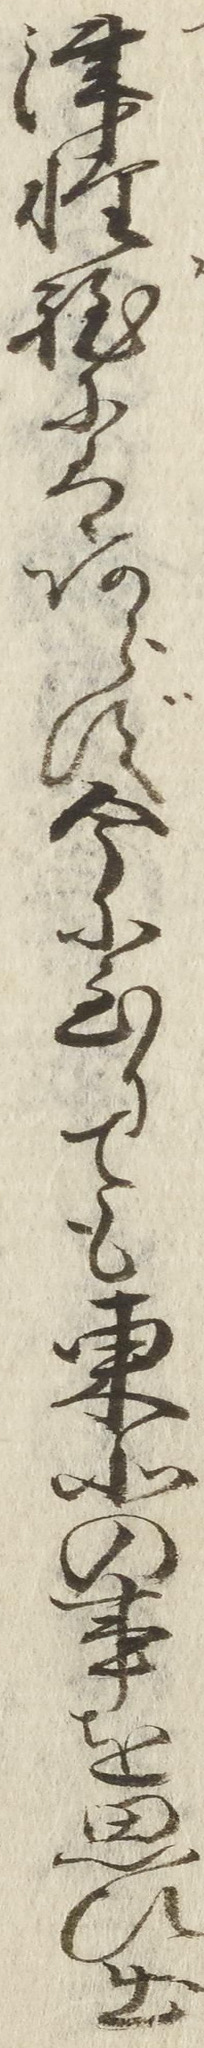津軽程にはあらず今に至りても東北の事を思ひ出
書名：天明奇畧　全
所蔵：東京大学地震研究所図書室 Earthquake Research Institute Library, The University of Tokyo, JAPAN
